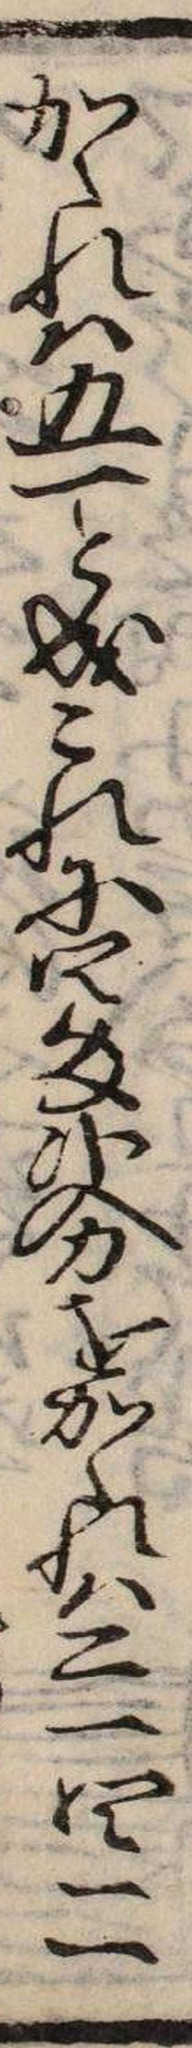かくれは五一と成これに四匁弐分をかくれは二一四一一
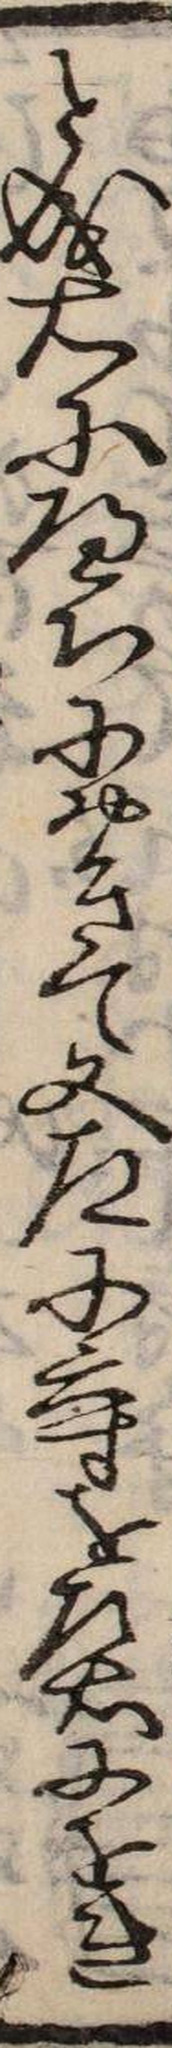と成右にへちにおきて又左に六寸を左右にをき
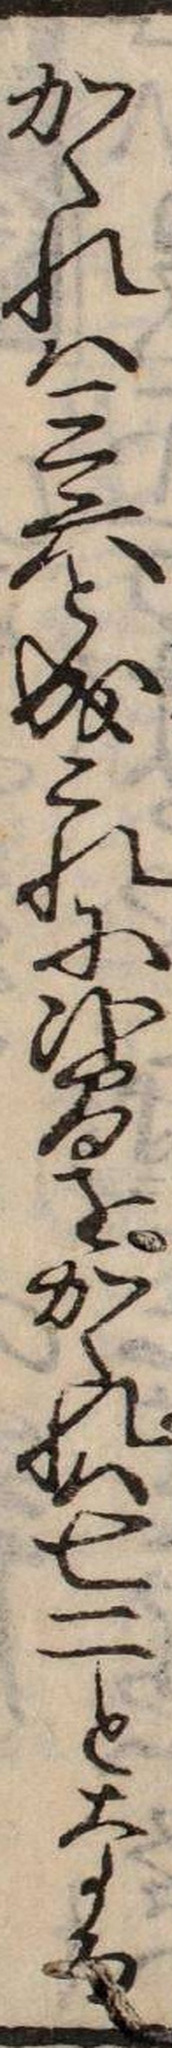かくれは三六と成これに弐間をかくれは七二となる
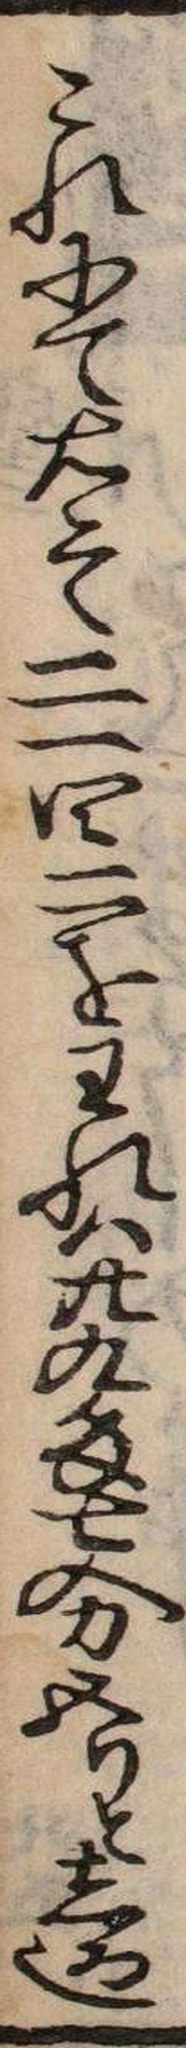これにて右の二一四二をわれは廿九匁七分五りとしる也

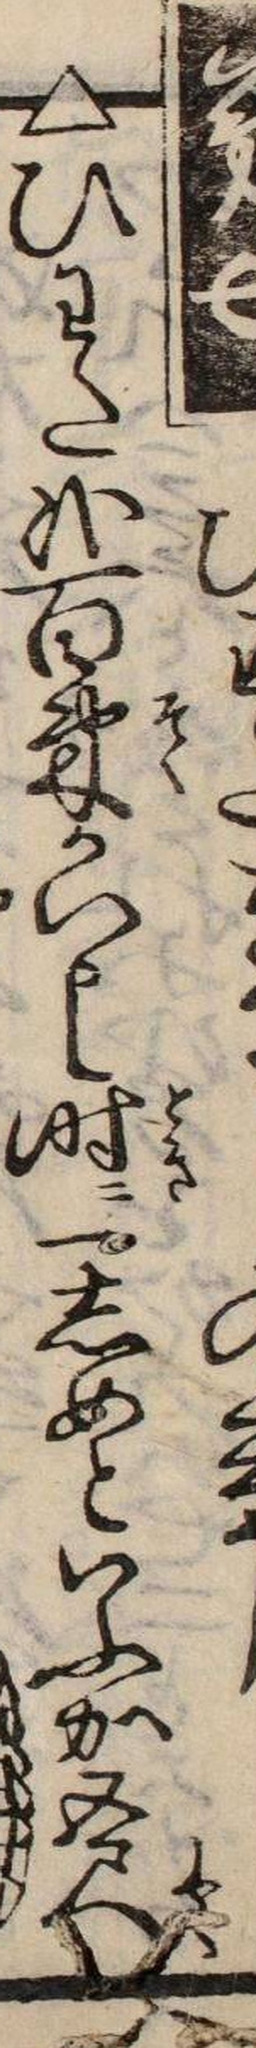△ひわた弐百束かい申候時に一しめといふか五尺
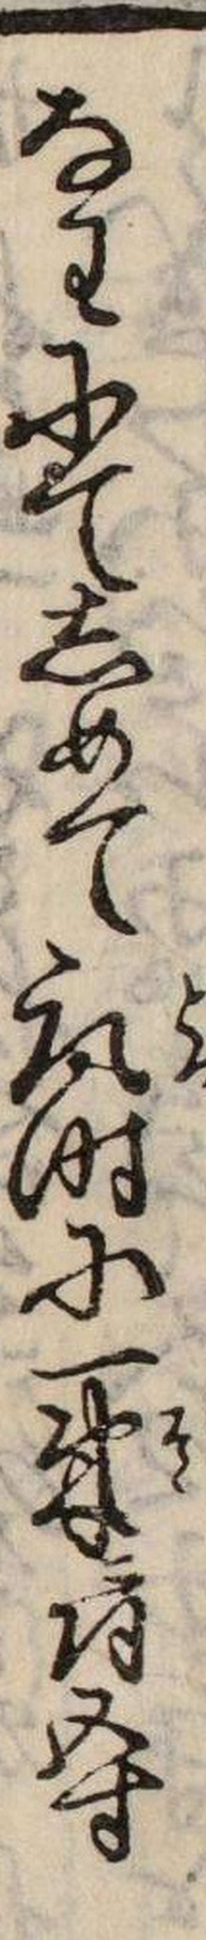なわにてしめて取時に一束に付五寸
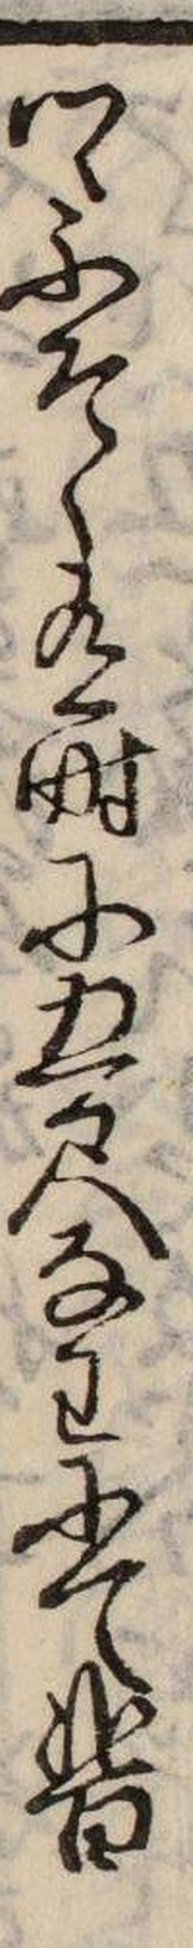つゝふそく有時に五尺なわにて弐百
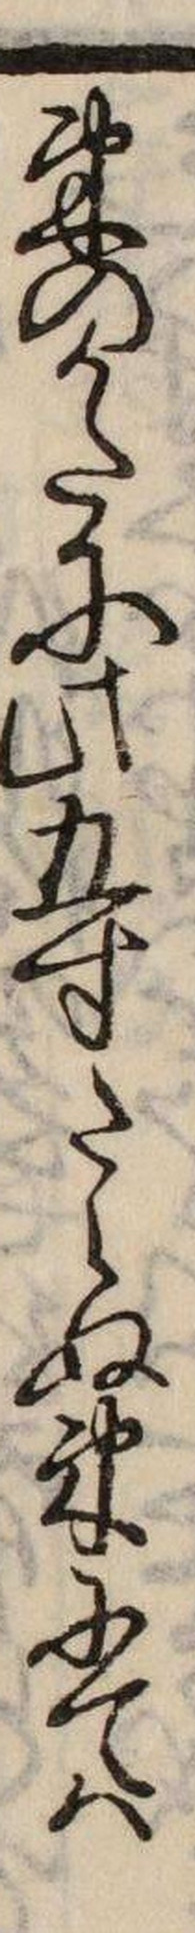束のかたに此五寸たらぬ束にては
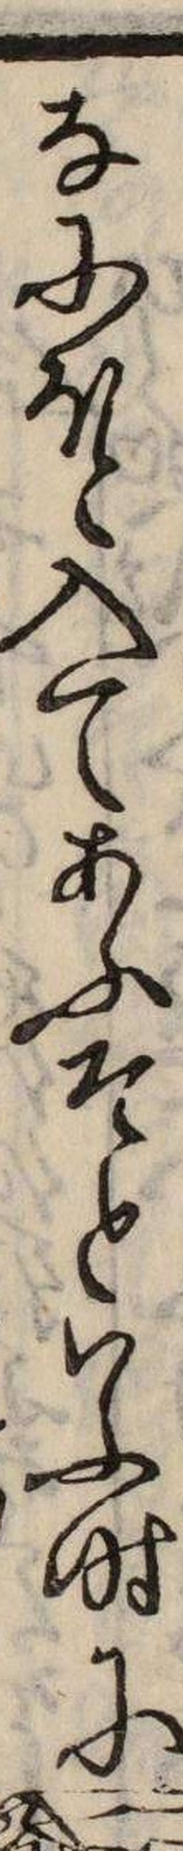なにほと入てあふそといふ時に
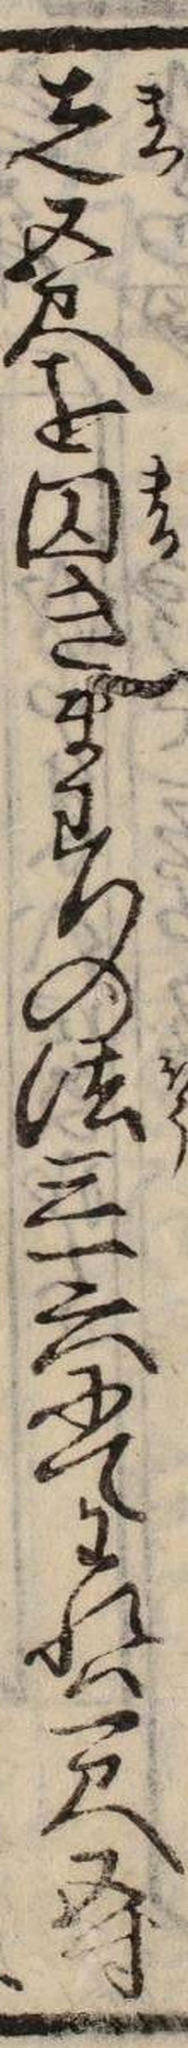先五尺を円きまわりの法三一六にてわれは一尺五寸
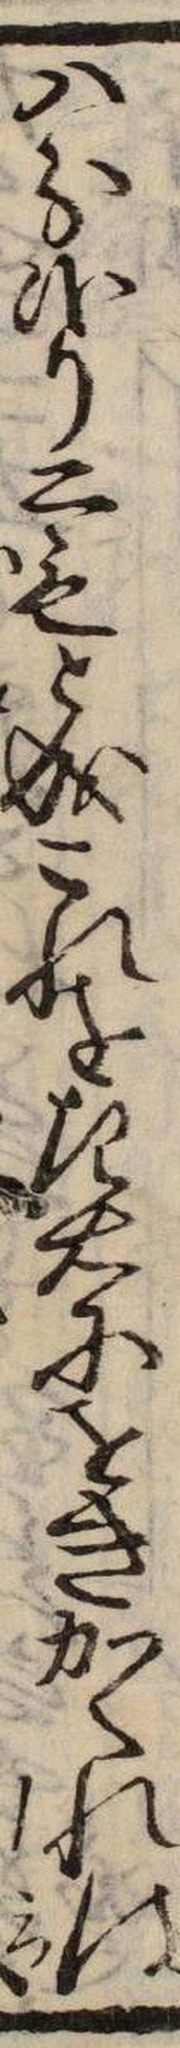八分弐り二毛と成これを左右にをきかくれは
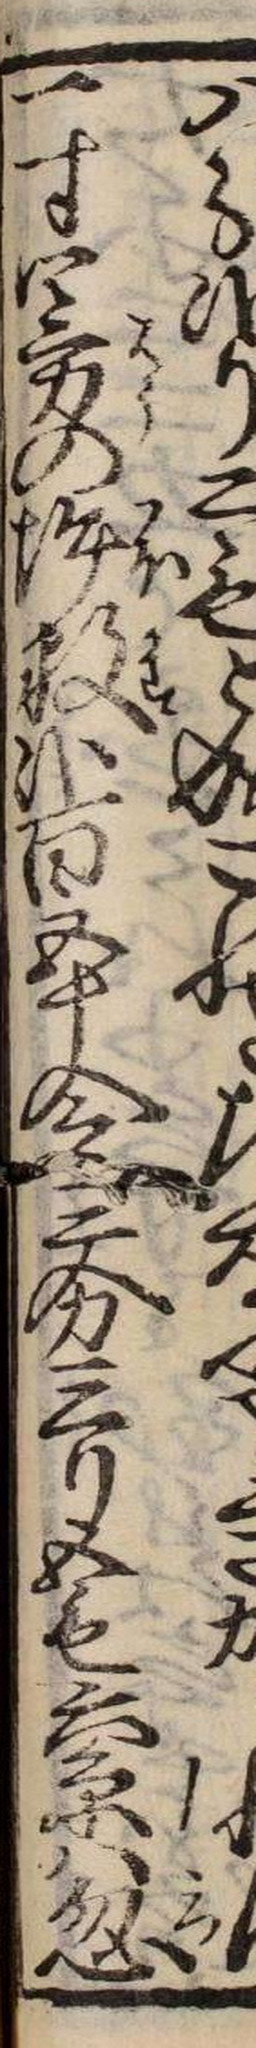一寸四方の坪数弐百五十令三分三り五毛六糸八忽
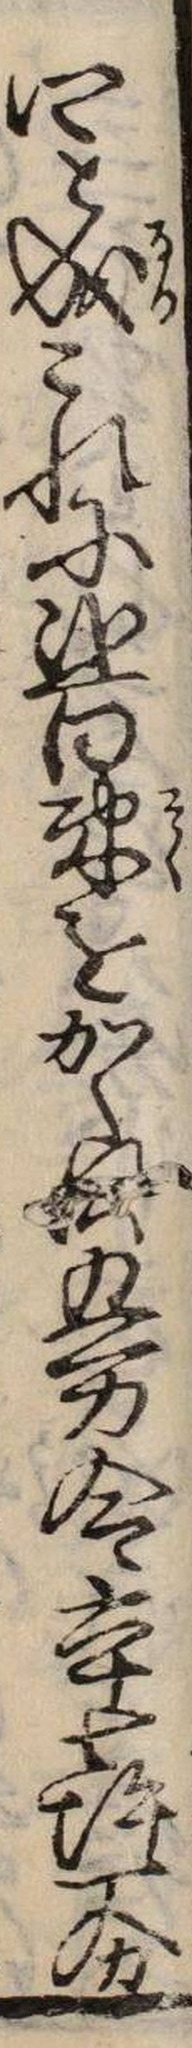四と成これに弐百束をかくれは五万令六十七坪一分
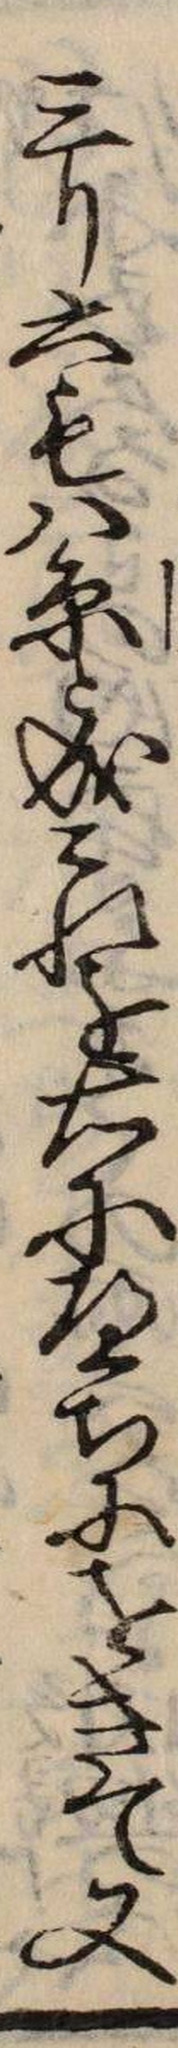三り六毛八糸と成これを右にへちにをきて又
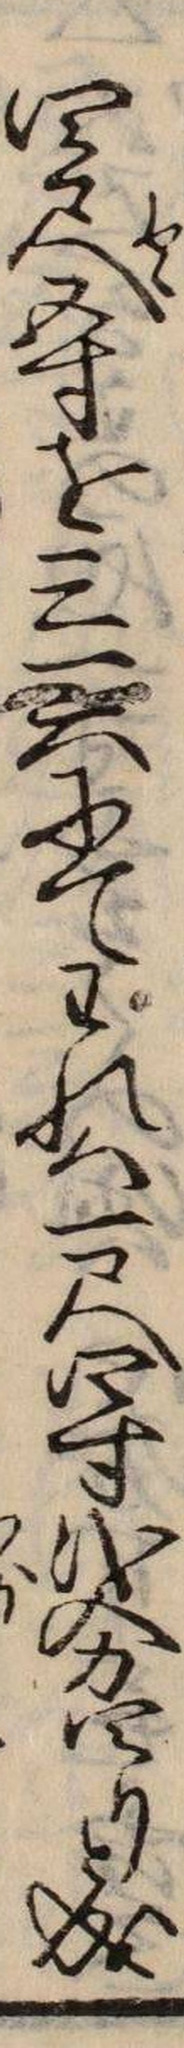四尺五寸を三一六にてわれは一尺四寸弐分四りと成
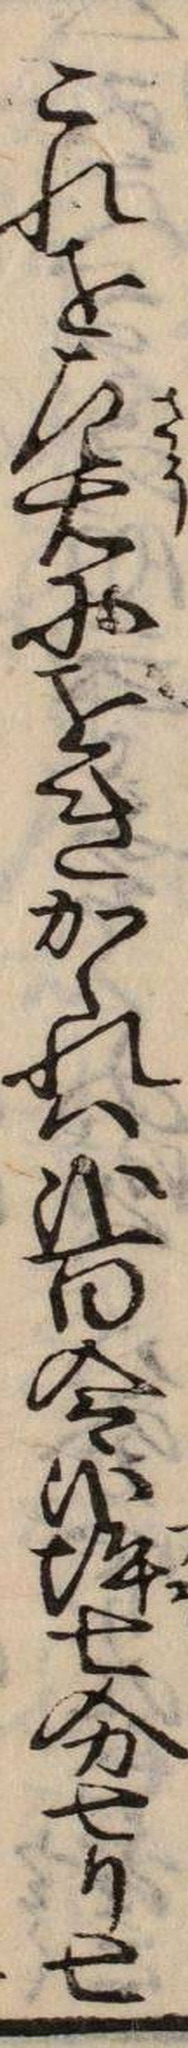これを左右にをきかくれは弐百令弐坪七分七り七
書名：塵劫記（寛永11年自跋、京都府立京都学・歴彩館追貴8）
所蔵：京都府立京都学・歴彩館 国文学研究資料館
